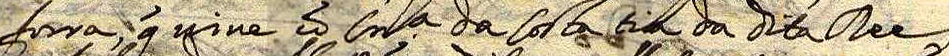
forra, q̄ vive cō Cn.a da Costa tia da dita Ree
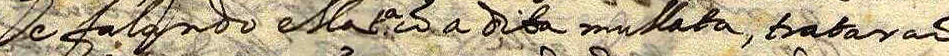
e falando ella ta cō a dita mullata, trataraõ
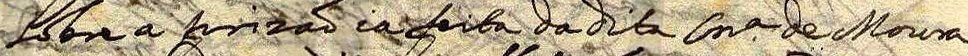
sobre a prizaõ ia feita da dita Cn.a de Moura,
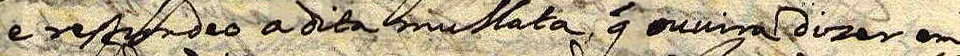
e respondeo a dita mullata, q̄ ouuira dizer em
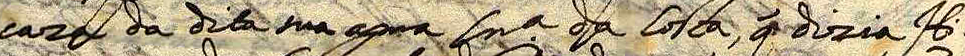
caza da dita sua ama Cn.a da Costa, q̄ dizia Hi
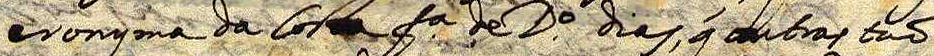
reonyma da Costa f.a de D.o dias, q̄ outras taõ
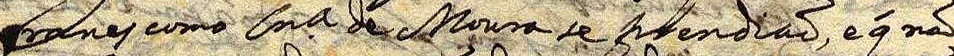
graues como Cn.a de Moura se prendiaõ, e q̄ naõ
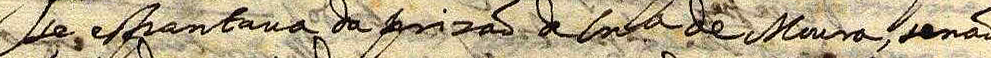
se espantaua da prizaõ de Cn.a de Moura, senaõ
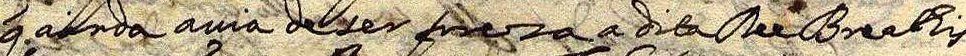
q̄ ainda auia de ser preza a dita Ree Breathis
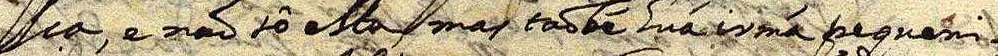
Lca, e naõ sô esta mas taõbē huā irmã pequeni
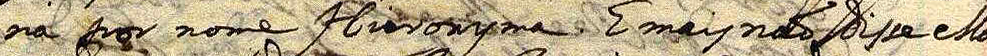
na por nome Hieronyma E mais naõ disse ella
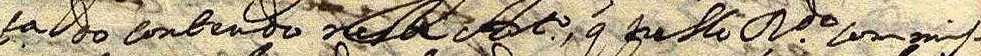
ta do conteudo neste Art.o, q̄ pello R.do commis
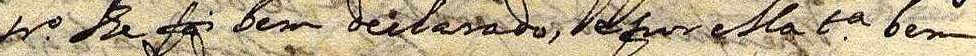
sro lhe foi bem declarado, e por ella t.a bem
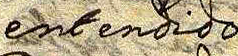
entendido
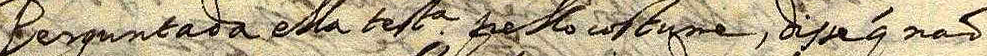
Perguntada ella test.a pello costume, disse q̄ naõ
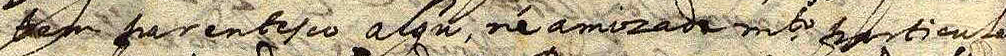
tem parentesco algū, nē amizade m.to particula
